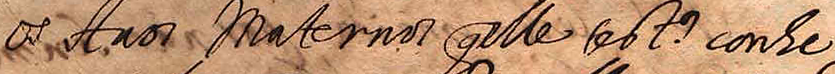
os Auos Maternos q̄ elle test.a conhe
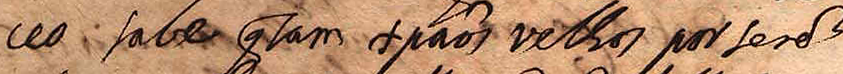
ceo sabe q̄ sam xpaõs velhos por serē
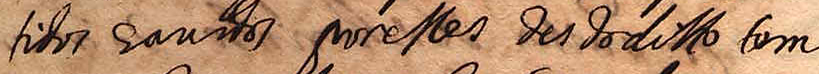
tidos E auidos por esses des do ditto tem
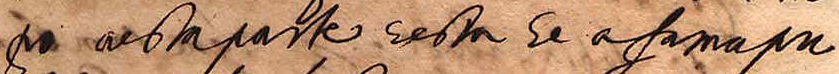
po a esta parte E esta he a fama pu
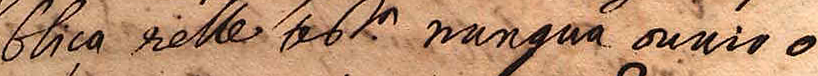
blica E elle test.a nunqua ouuio o
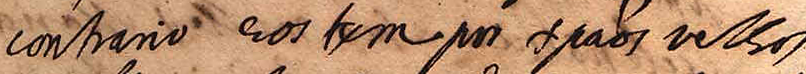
contrario E os tem por xpaõs velhos
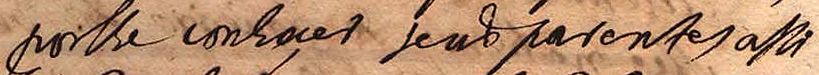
por lhe conhecer seus parentes assi
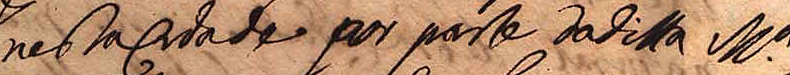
nesta Cidade por parte da ditta M.a
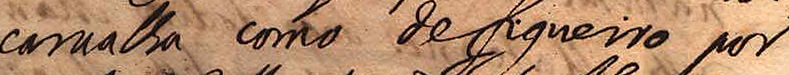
carualha como de figueiro por
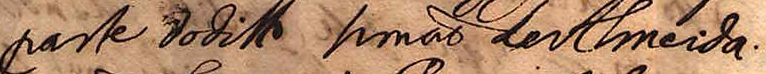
parte do ditto simaõ de Almeida.
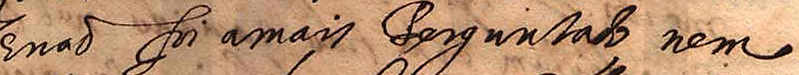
E naõ foi a mais Perguntado nem
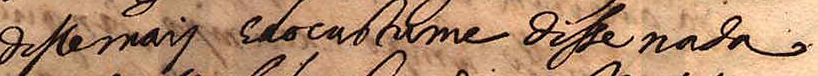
disse mais E do custume disse nada
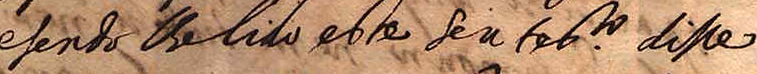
e sendo lhe lido este seu test.o disse
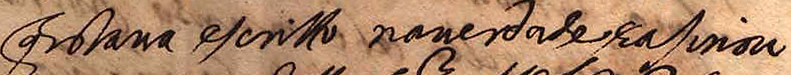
q̄ estaua escritto na uerdade E asinou
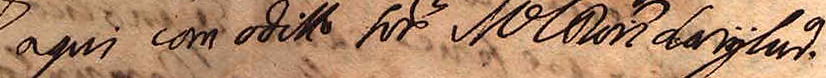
aqui com o ditto sor̄ Mel Roīz da sylura.
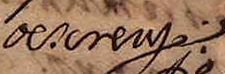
o escreuj.
